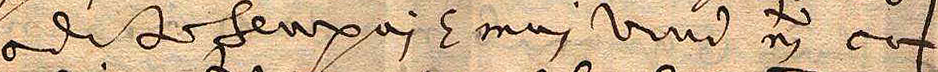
o dito seu paj E maj viuē mto ca
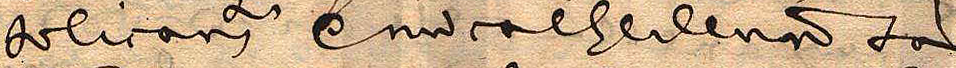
tolicamte e nūca lhe deu cōta
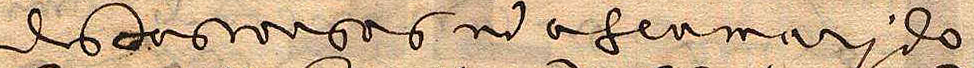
destas cousas nē a seu marjdo
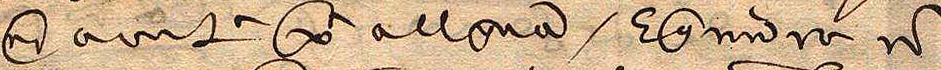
nē a outa p̄a allguā / E q̄ nūca cō
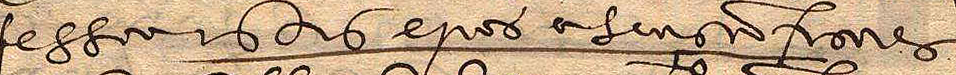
fessou estes erros a seus cōfesores
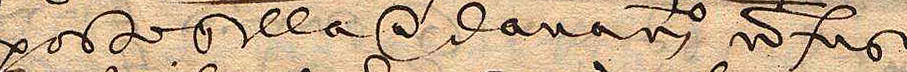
posto q̄ ella ādaua mto cōfusa
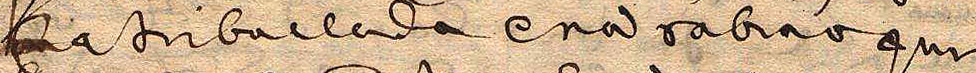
e atribullada e nā sabia o que
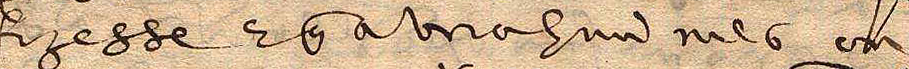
fizesse E q̄ avera huū mes ou
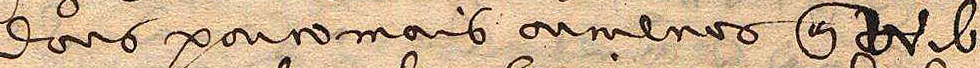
dous pouco mais ou menos q̄ vēdo
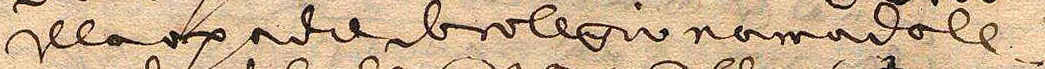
ella o padre do colegio na madale
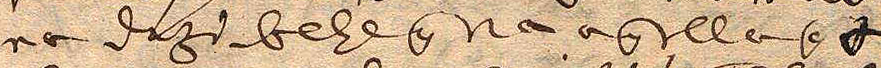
na dizēdo lhe q̄ era aq̄lla q̄ tj
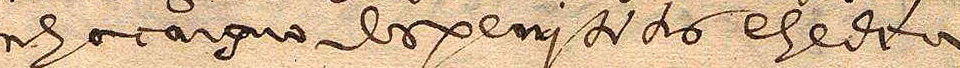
nha carguo dos penjtētes lhe deu
